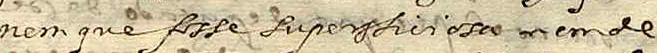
nem que fosse supersticiosa nem de
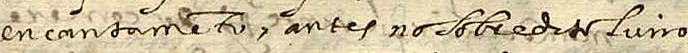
encantamēto, antes no sobredito liuro
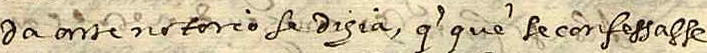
da arte notorio se dizia, q̄ quē se confessasse
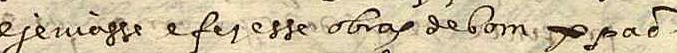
e jeiuasse e fezesse obras de bom xpaõ
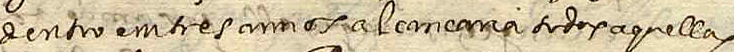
dentro em tres annos alcançaria todas aquellas
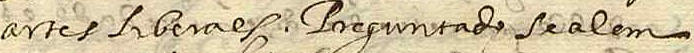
artes Liberaes. Preguntado se alem
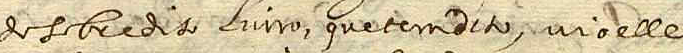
do sobredito Liuro, que tem dito, uio elle
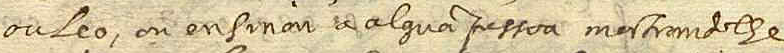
ou Leo, ou ensinou a alguā pessoa mostrandolhe
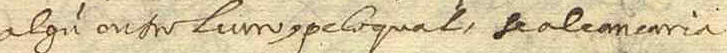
algū outro Liuro, pelo qual, se alcançaria
